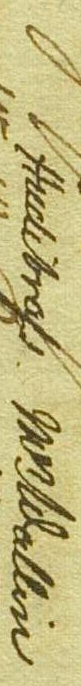Hudibrass M^r Adallin
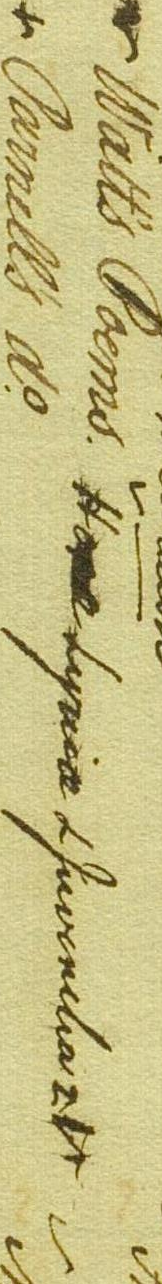- Watt's Poems. [____] Lyrics & Juvenelia [___]
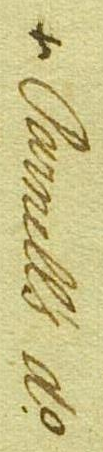- Parnell's d^o.
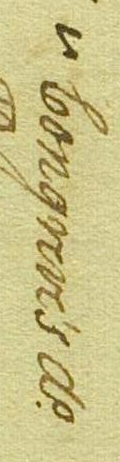- Congreve's d^o.
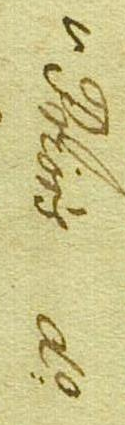- Prior's d^o.
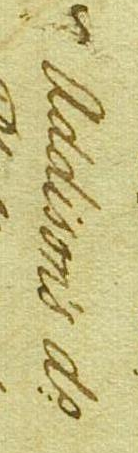- Addison's d^o.
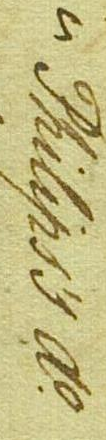- Philips's d^o.
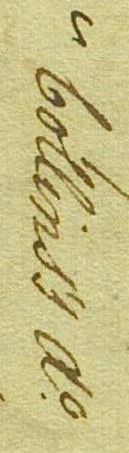- Collins's d^o.
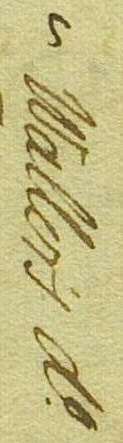- Waller's d^o.
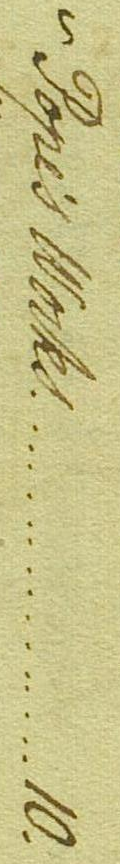- Pope's Works. . . . . . . . 10.
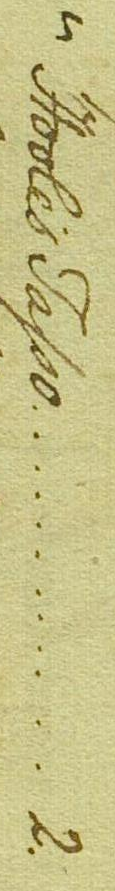- Hoole's Tasso. ........... 2.
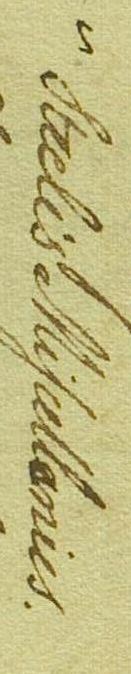- Steele's Miscellanies.
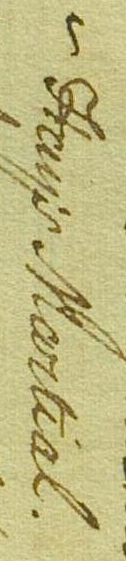- Hay's Martial.
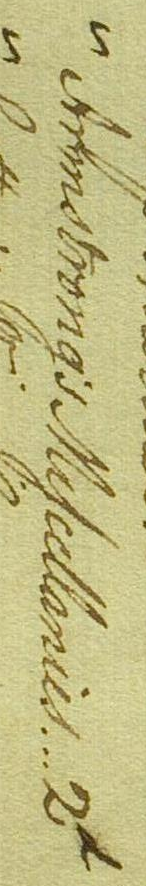- Armstrong's Miscellanies... 2^d
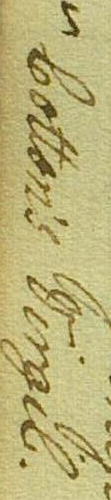- Cotton's Virgil.
